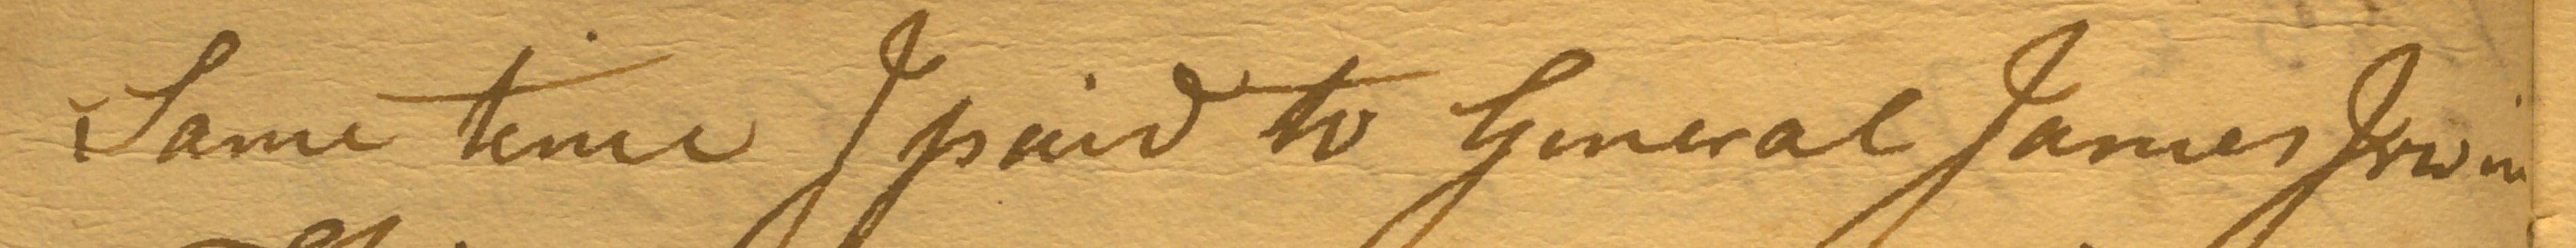same time I paid to General James Irwin
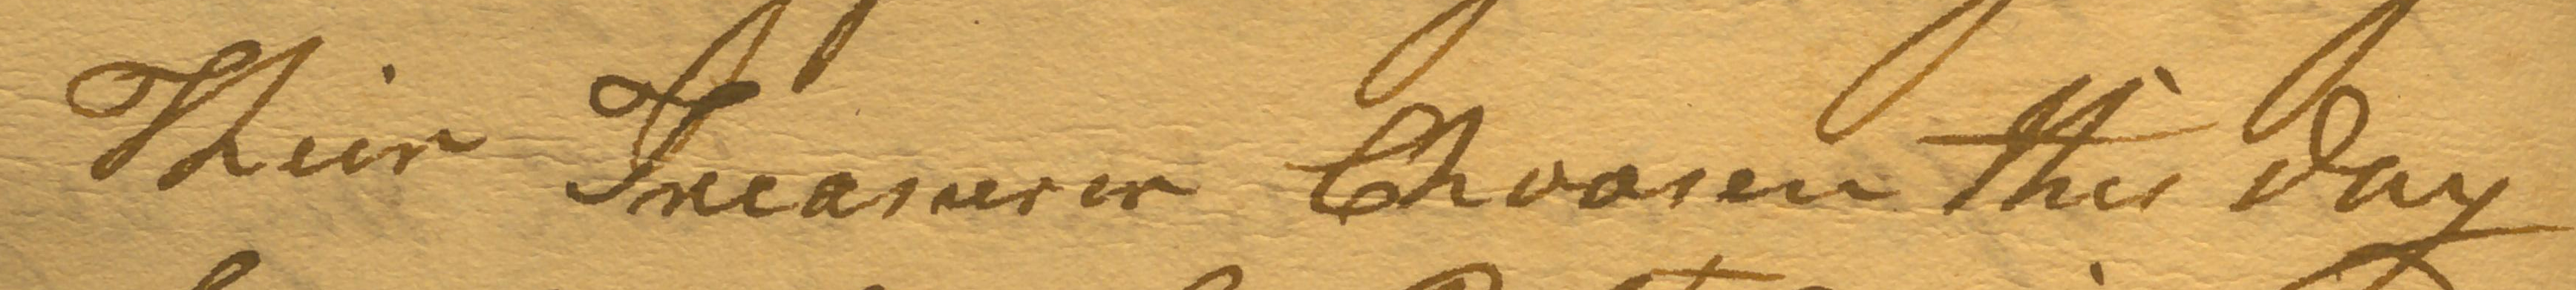Their Treasurer Choosen this day
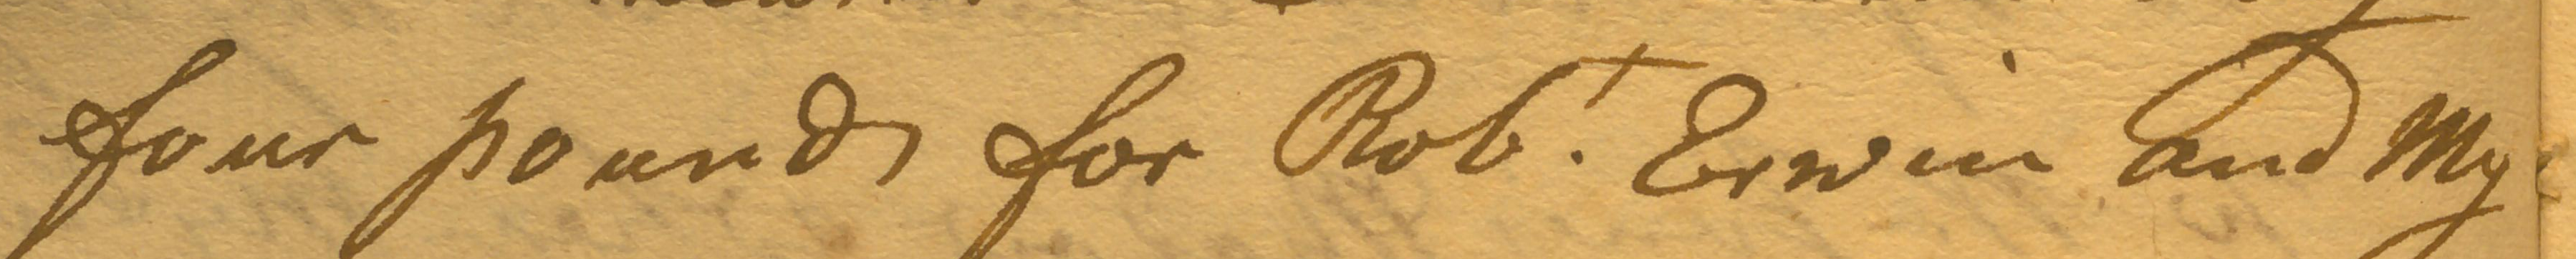four pounds for Rob^t. Erwin and My
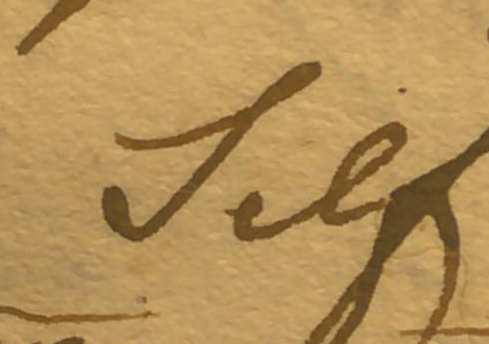self
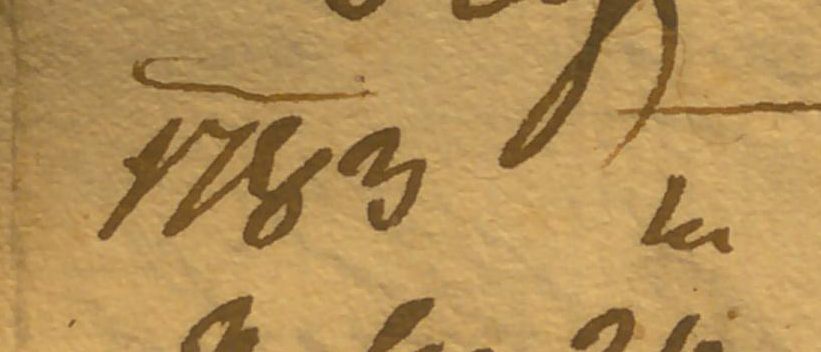1783
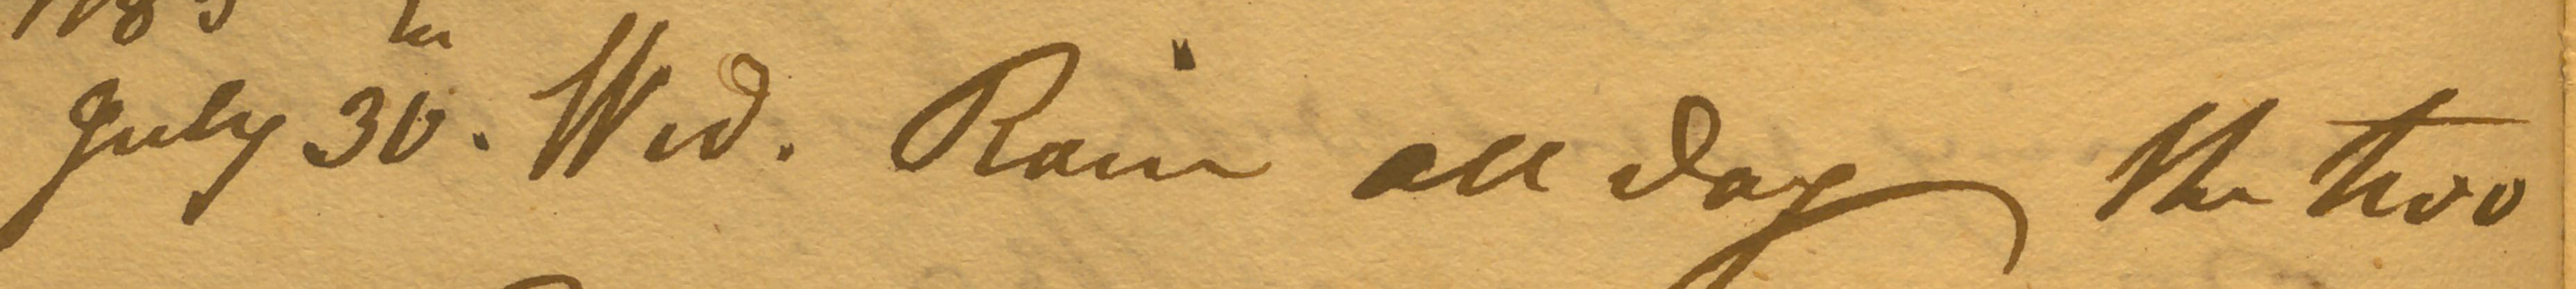July 30^th. Wed. Rain all day the two
